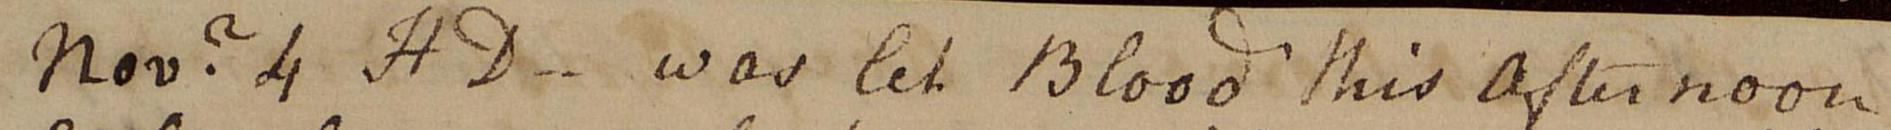Nov^r. 4 HD- was let Blood this afternoon
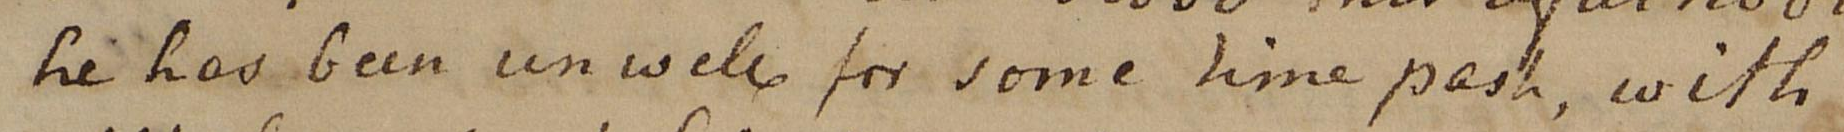he has been unwell for some time past, with
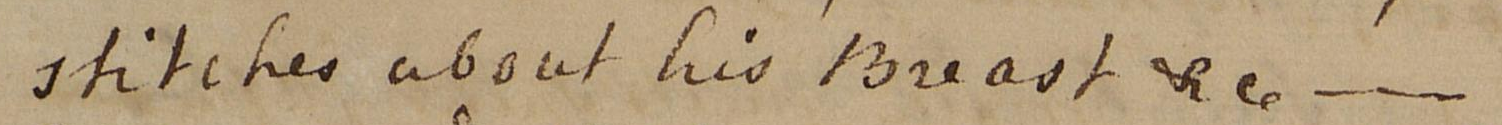stitches about his Breast &c-
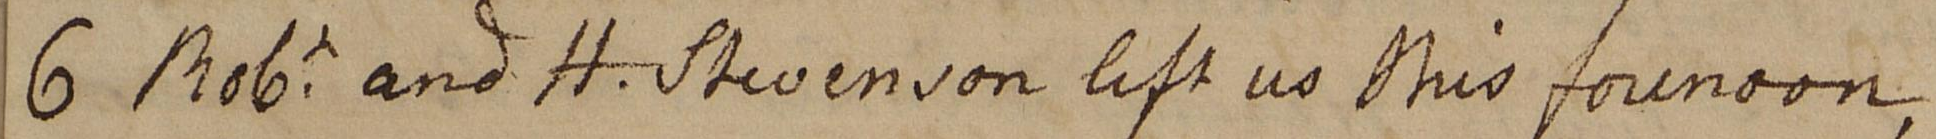6 Rob^t. and H. Stevenson left us this forenoon,
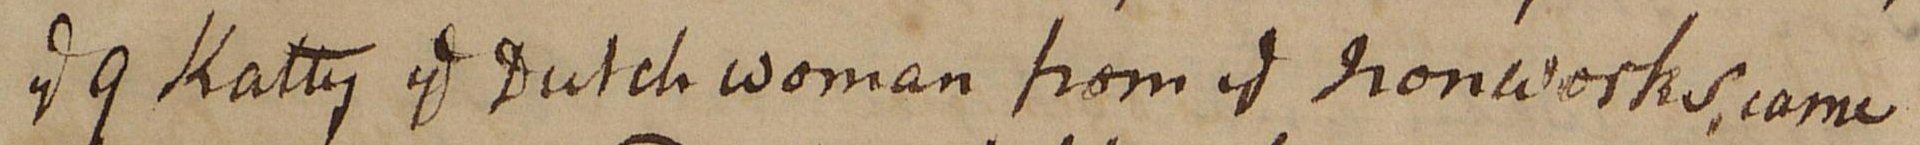y^e 9 Katty y^e Dutch woman from y^e IronWorks, came
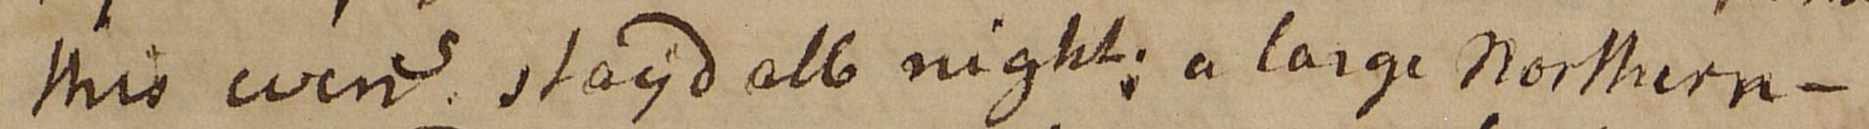this even^g. stay'd all night, a large Northern-
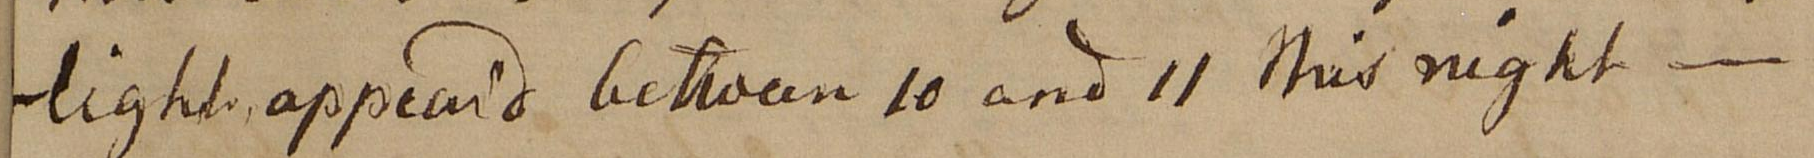light appear'd between 10 and 11 this night-
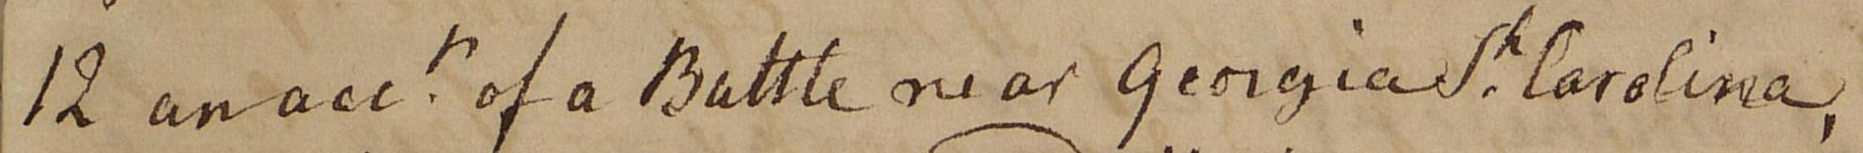12 an acc^t. of a Battle near Georgia S^h. Carolina,
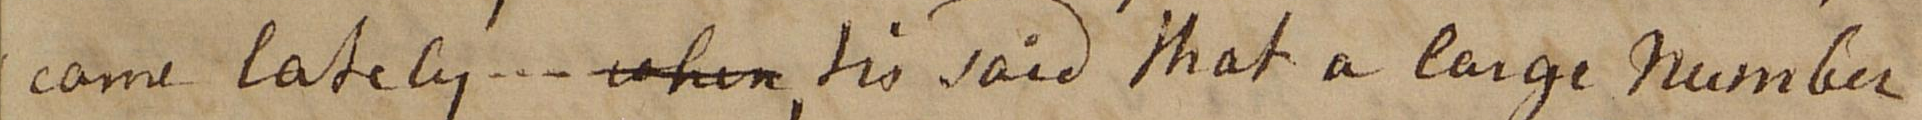came lately-- when, tis said that a large number
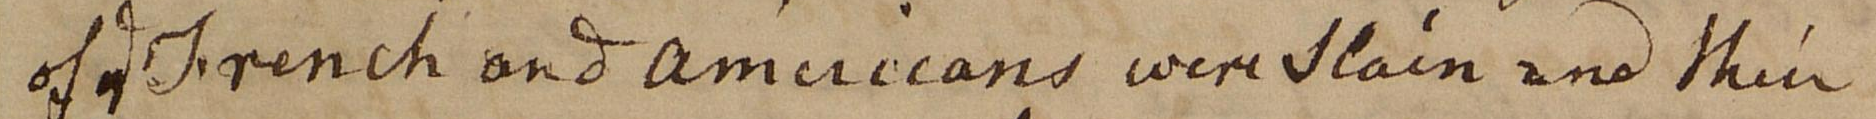of y^e French and Americans were slain and their
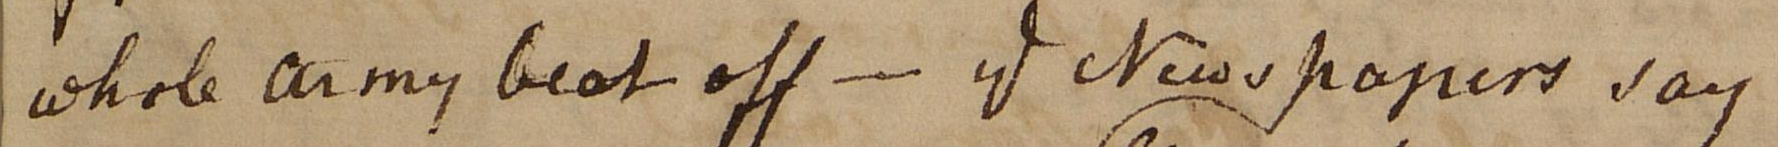whole army beat off- y^e News papers say
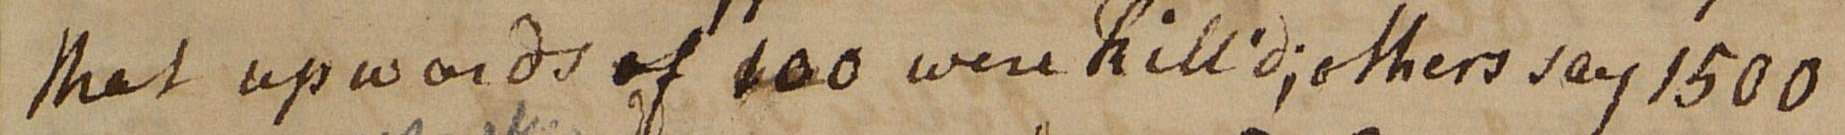that upwards of 100 were kill'd; others say 1500
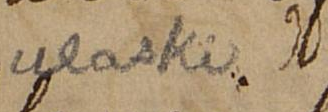ulaski
